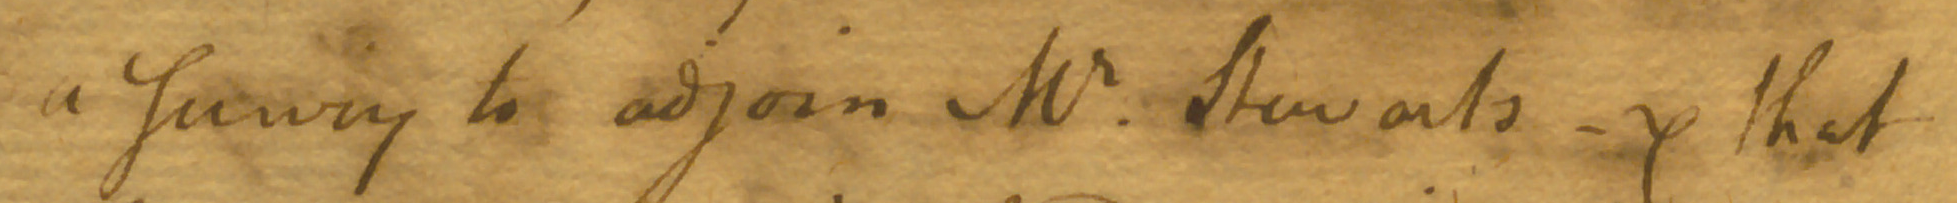a survey to adjoin M^r. Stewarts- & that
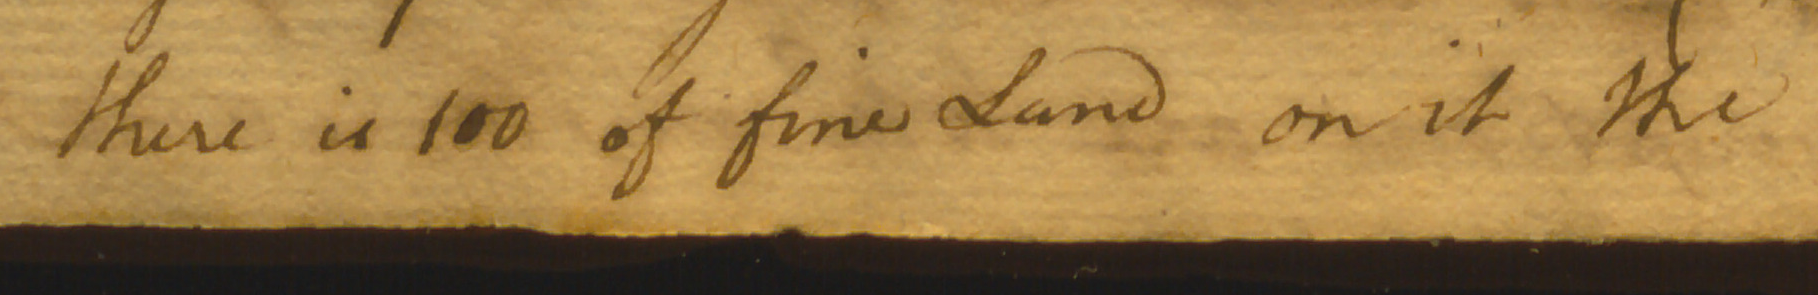there is 100 of fine Land on it the
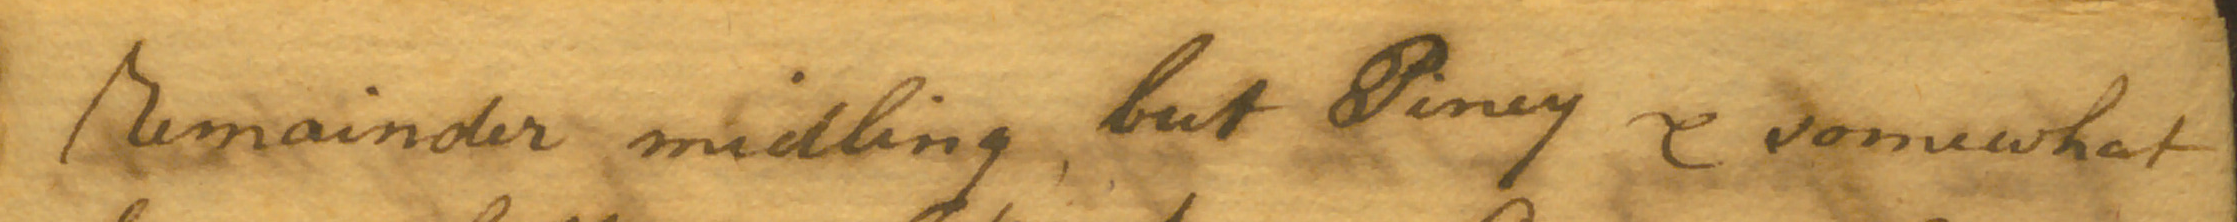remainder midling but Piney & somewhat
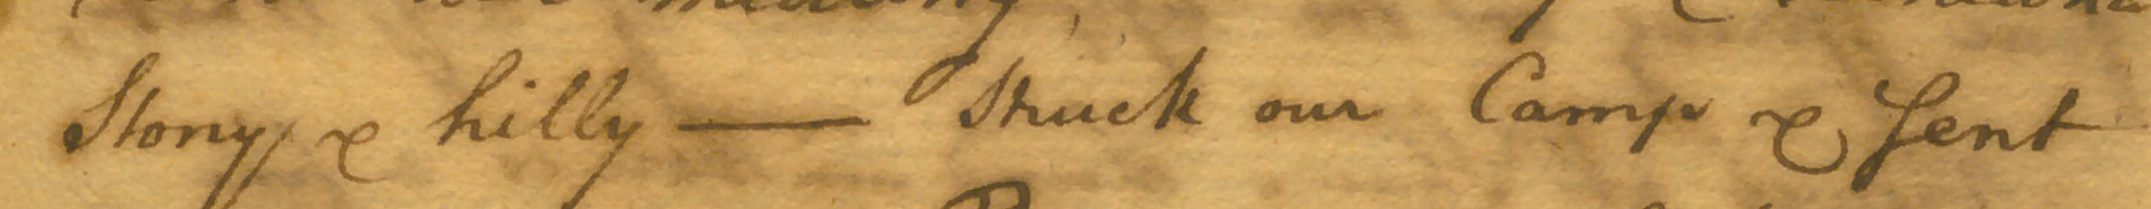Stony & hilly- Struck our Camp & sent
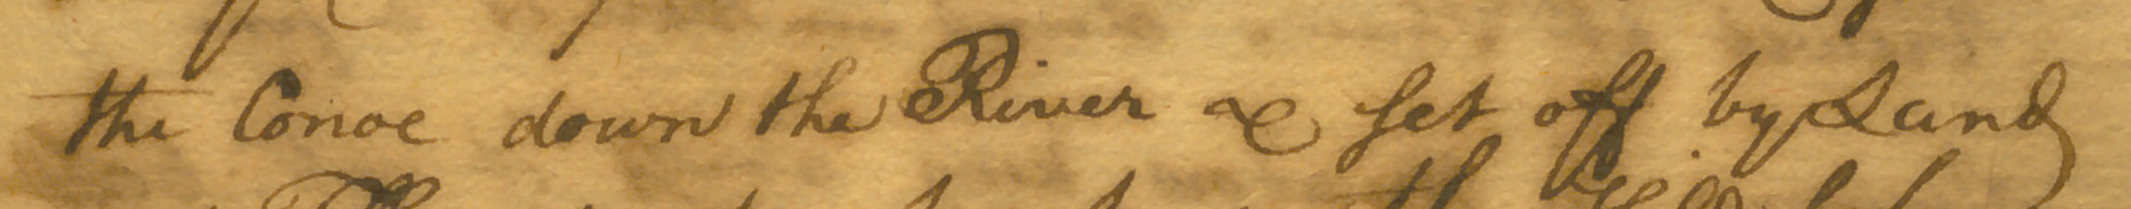the conoe down the River & set off by Land
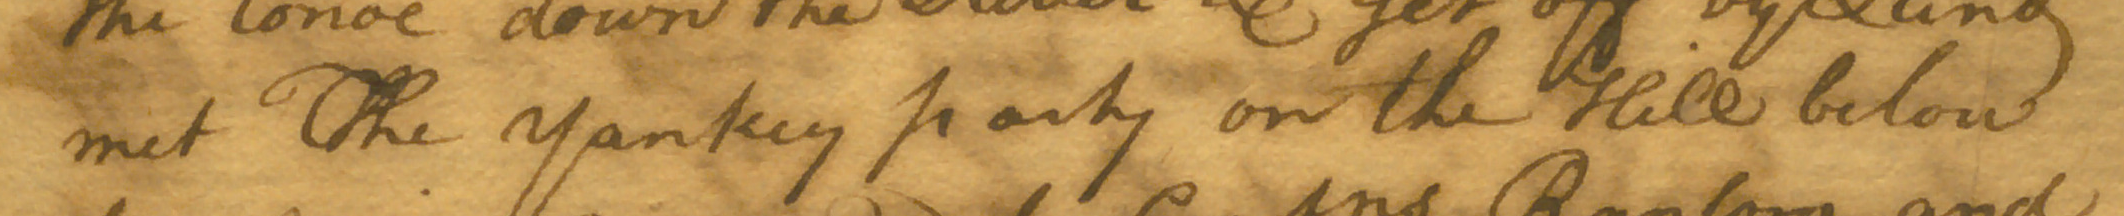met The yankey party on the Hill below
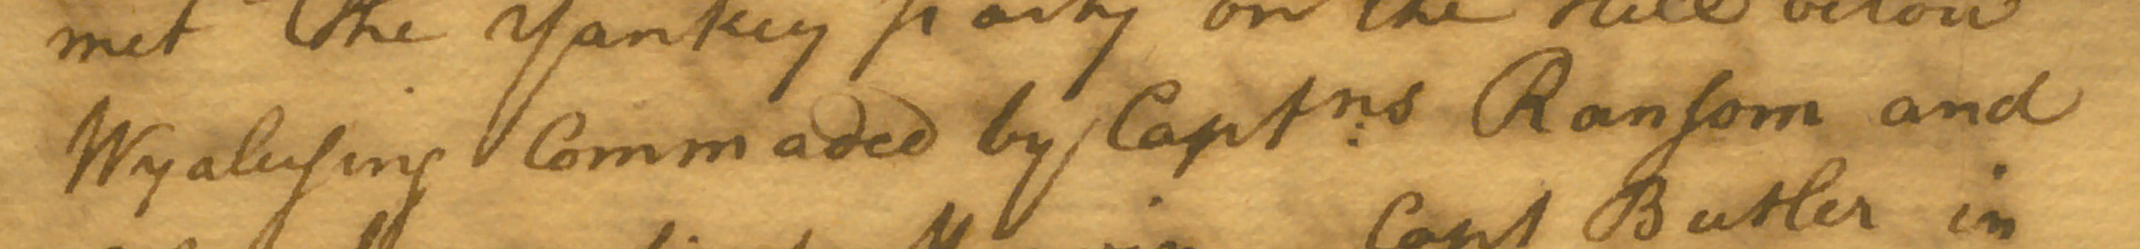Wyalusing commanded by Capt^ns: Ransom and
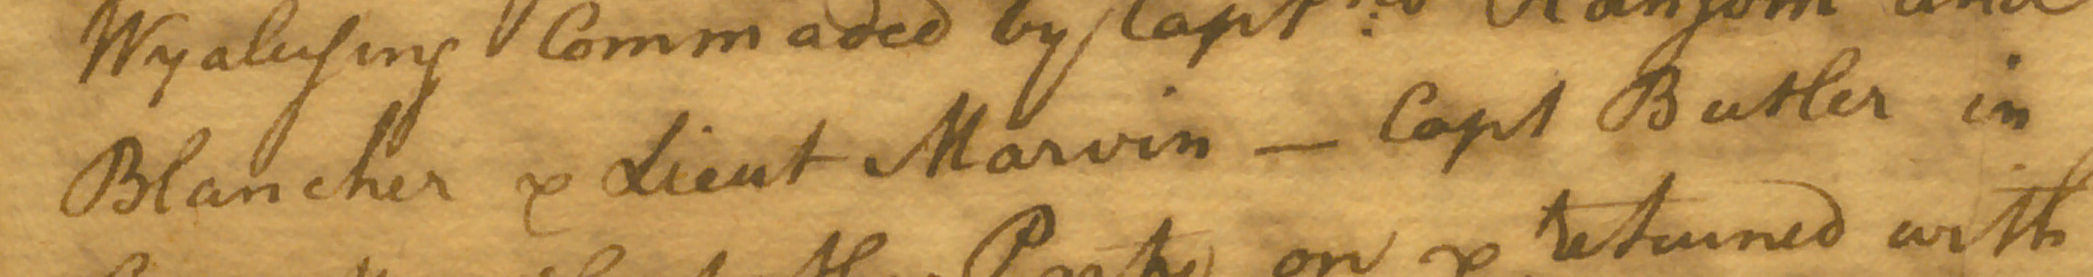Blancher & Lieut Marvin- Capt Butler in
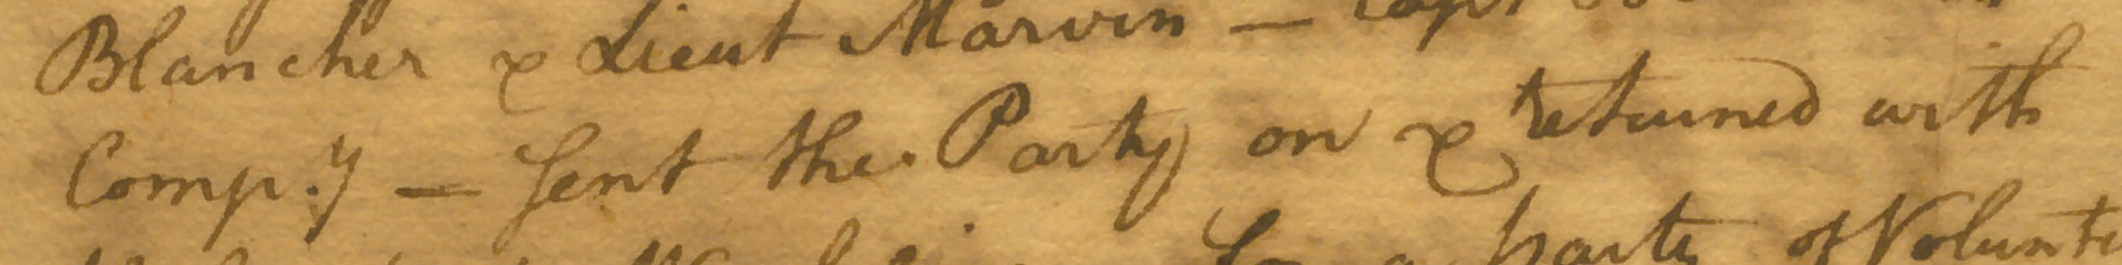Comp^y.- Sent the Party on & returned with
